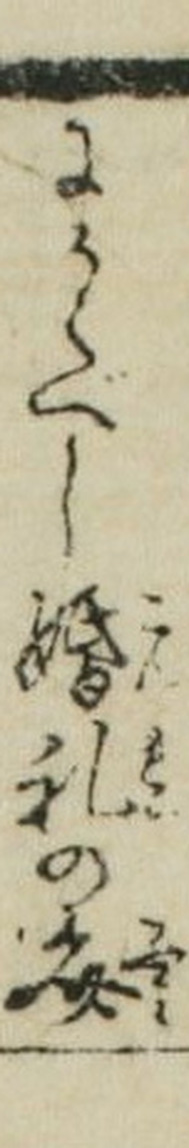にかくべし婚礼の文
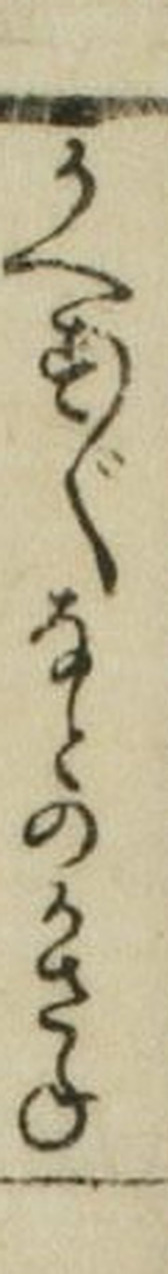かへす〴〵なとのかさね
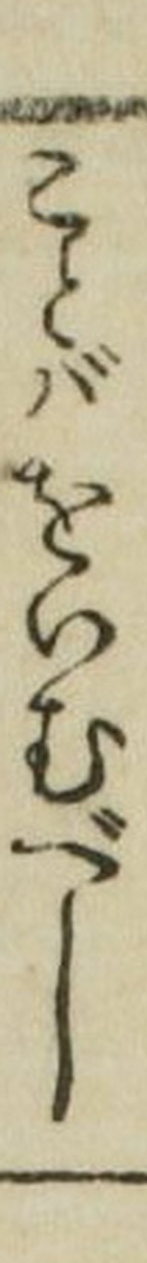ことばをいむべし
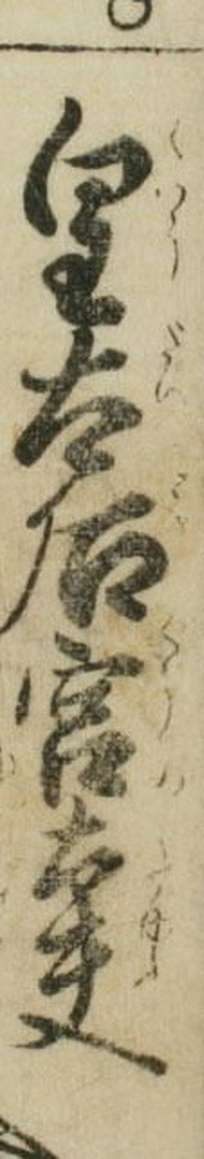皇太后宮太夫
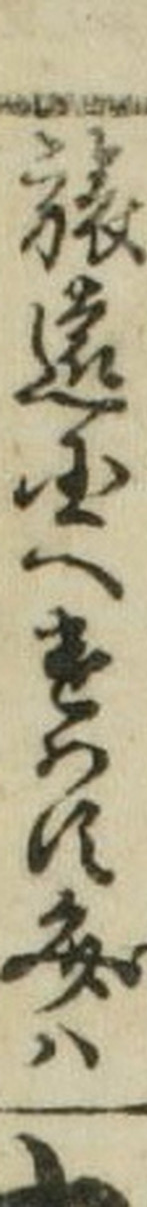旅遠国へ遣はす文は
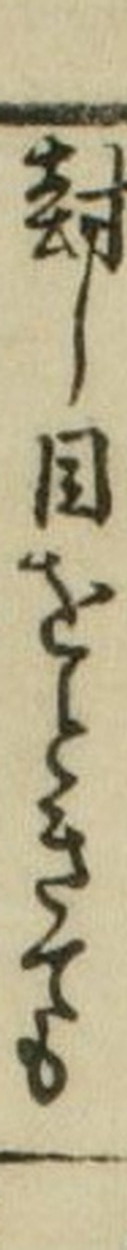封し目をときても
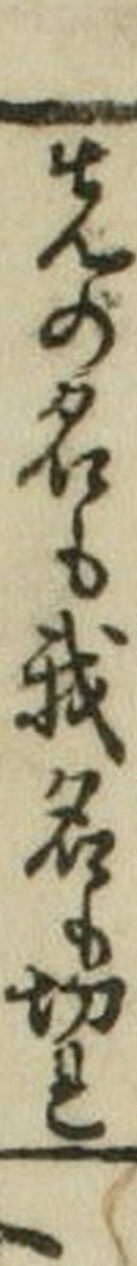先の名も我名も切れ
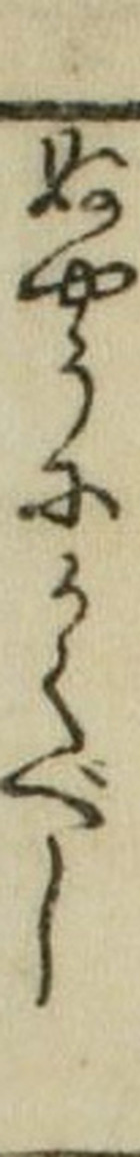ぬやうにかくべし
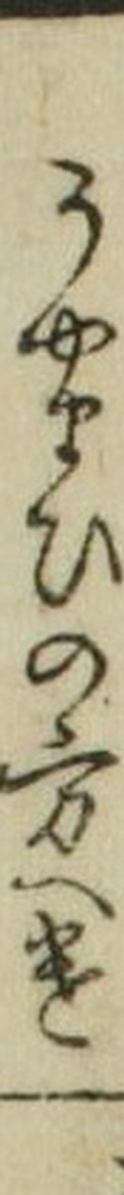うやまひの方へ遣
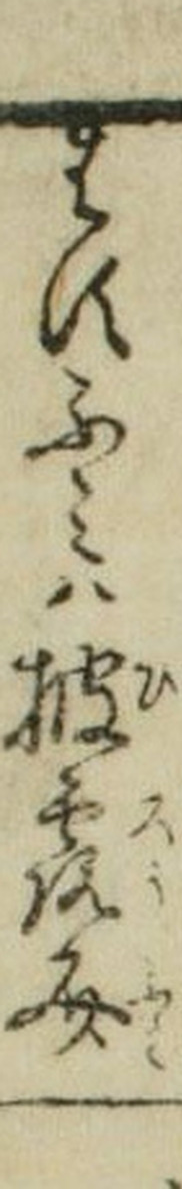はすふみは披露文
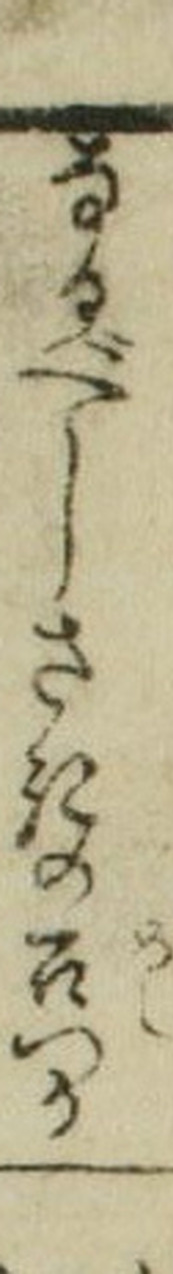なるべしさきの召つか
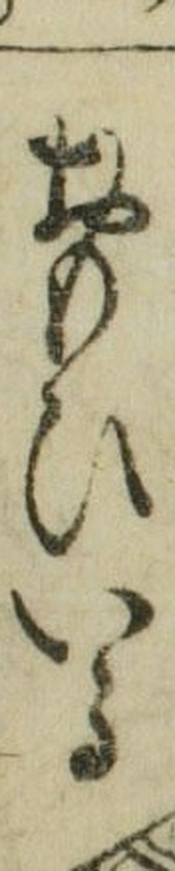おもひいる
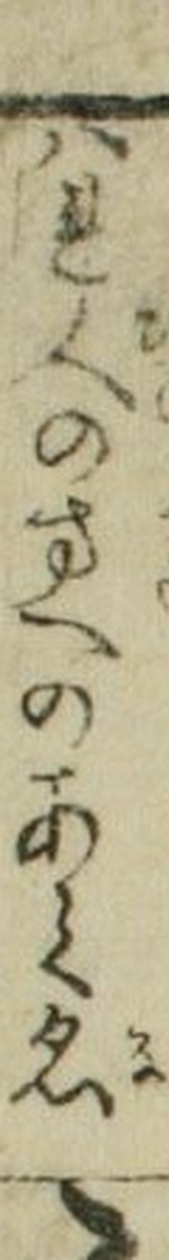はれ人の方へのあて名
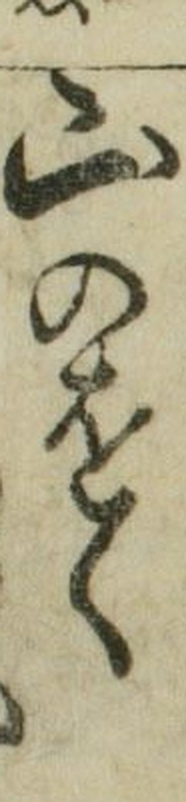山のをく
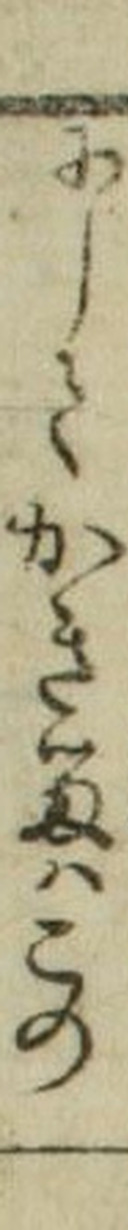にしてかき留はこの
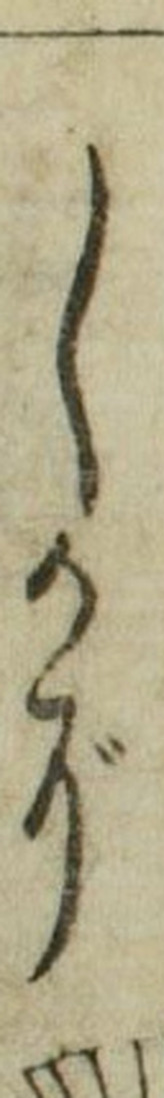しかぞ
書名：百人一首
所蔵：東京学芸大学教育コンテンツアーカイブ
